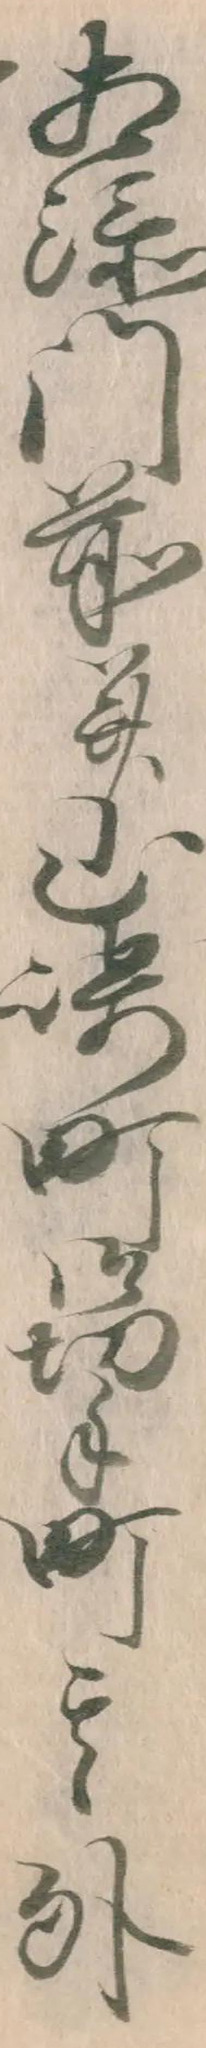相添門前并山崎町御切手町其外
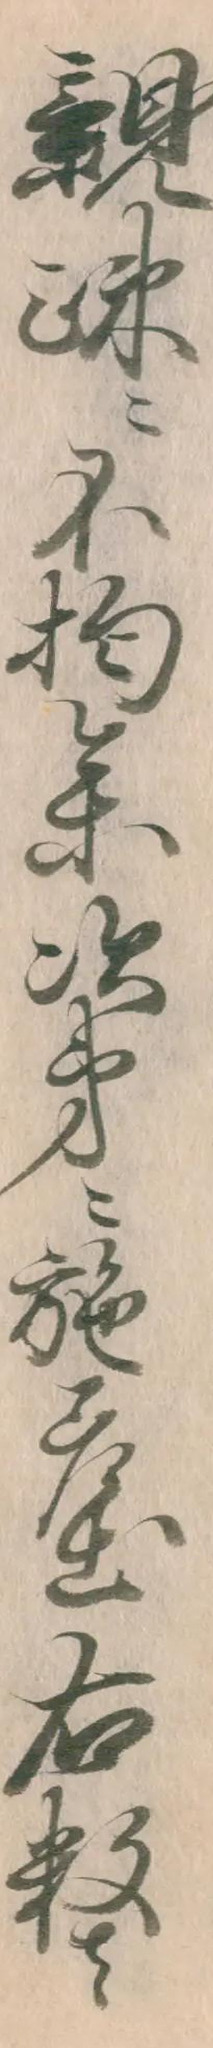親疎ニ不拘参次第ニ施差出右数は
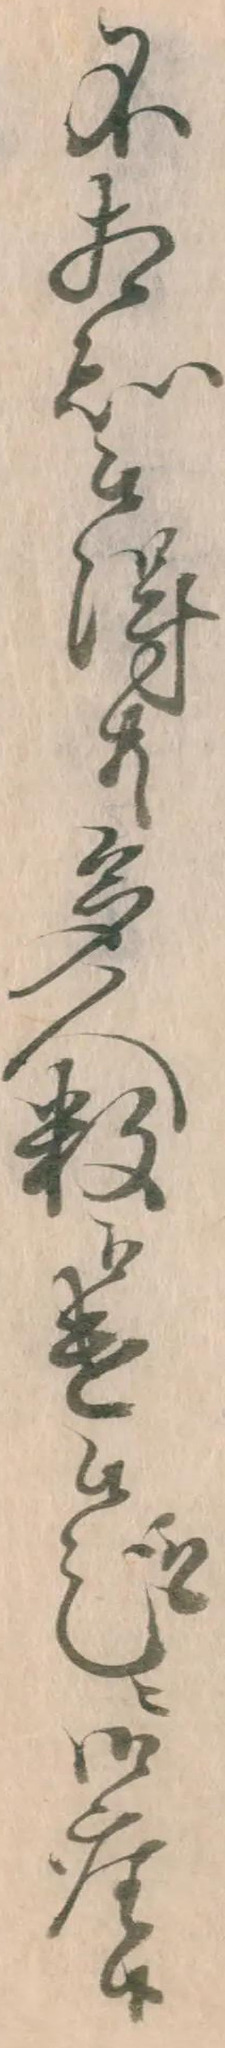不相知候得共多人数え遣候趣ニ御座候
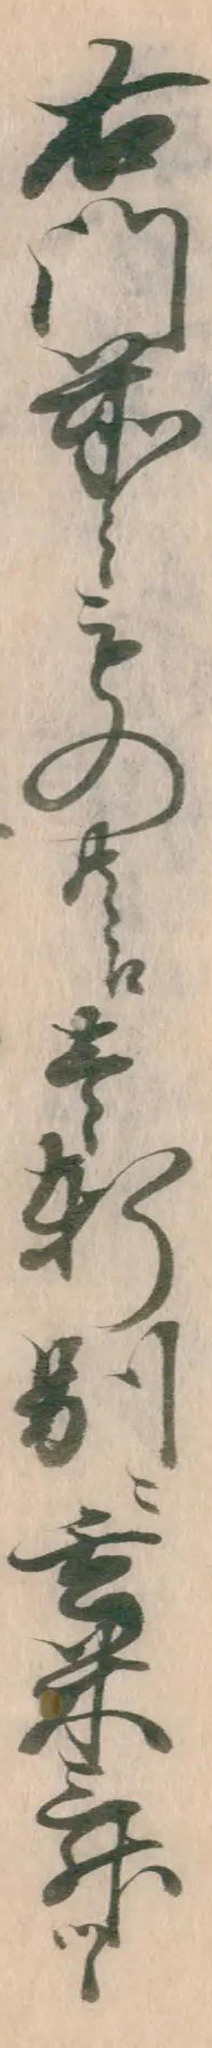右門前之もの共え壱軒別ニ玄米三升ツヽ
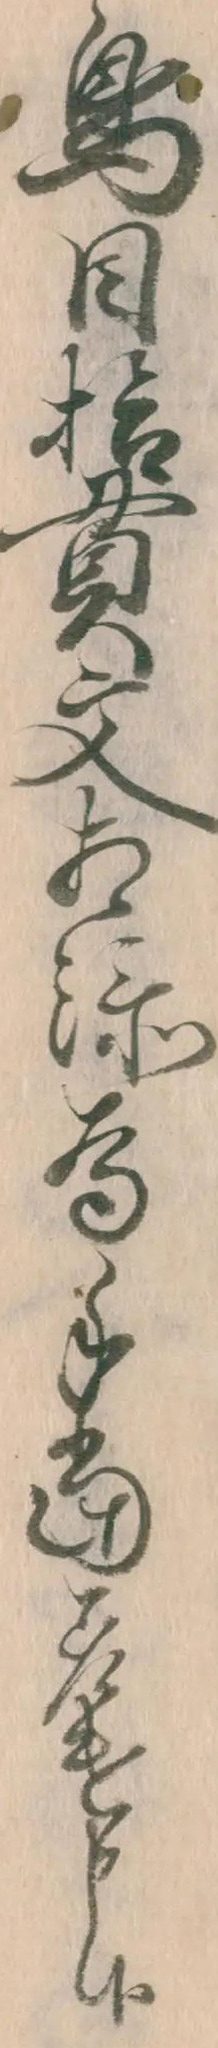鳥目拾貫文相添為手当差遣申候
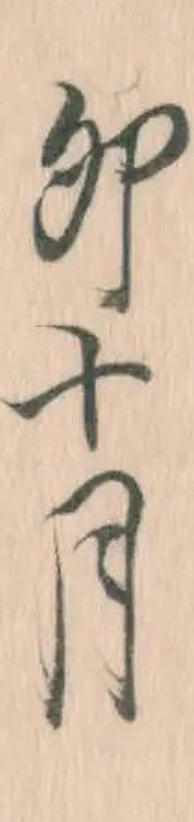卯十月
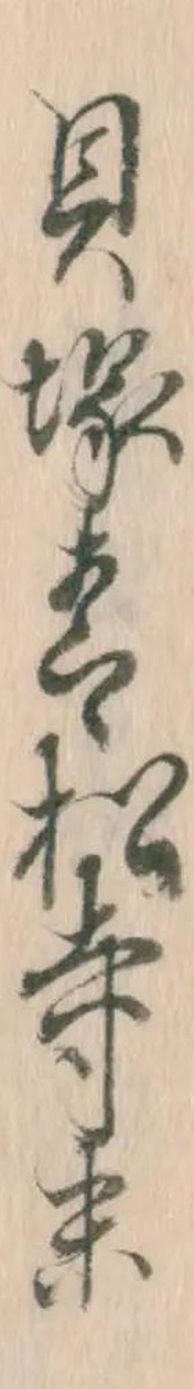貝塚青松寺末
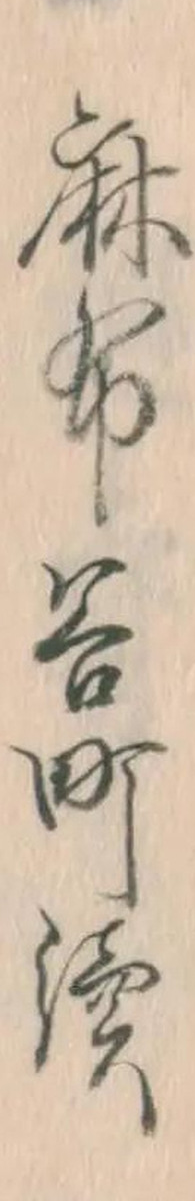麻布谷町続
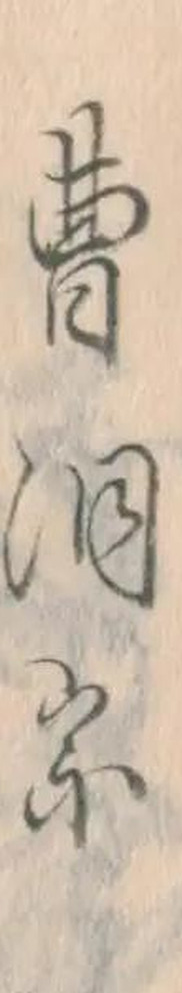曹洞宗
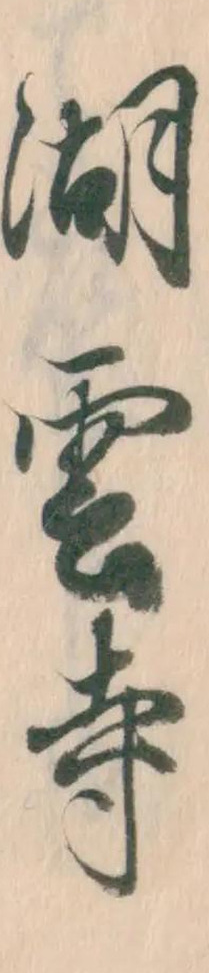湖雲寺
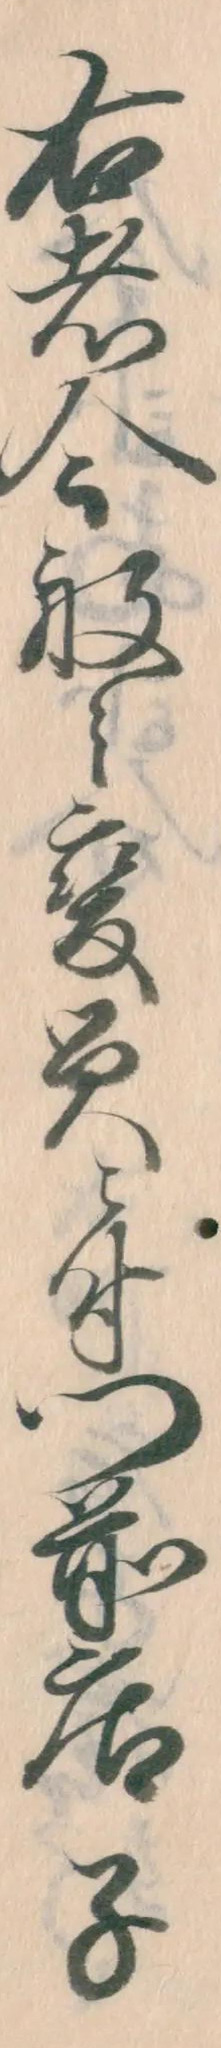右は今般之変災ニ付門前店子
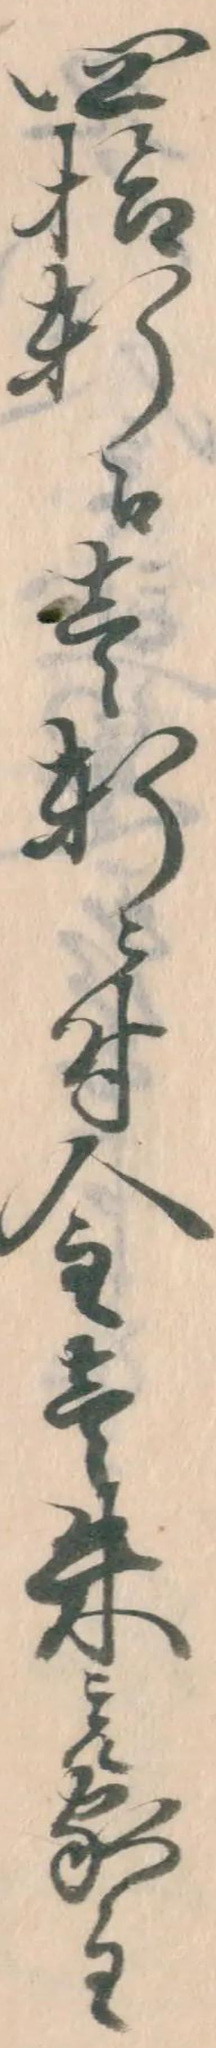四拾軒え壱軒ニ付金壱朱宛家主

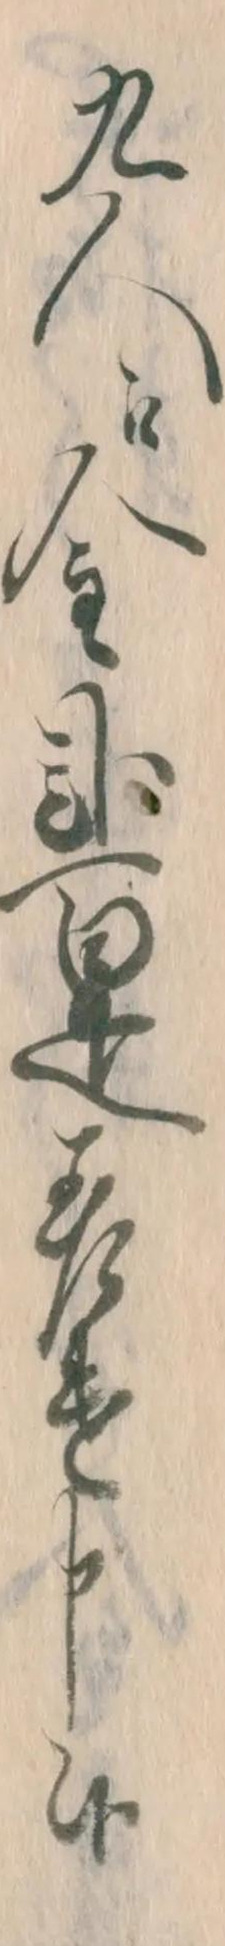九人え金弐百疋差遣申候
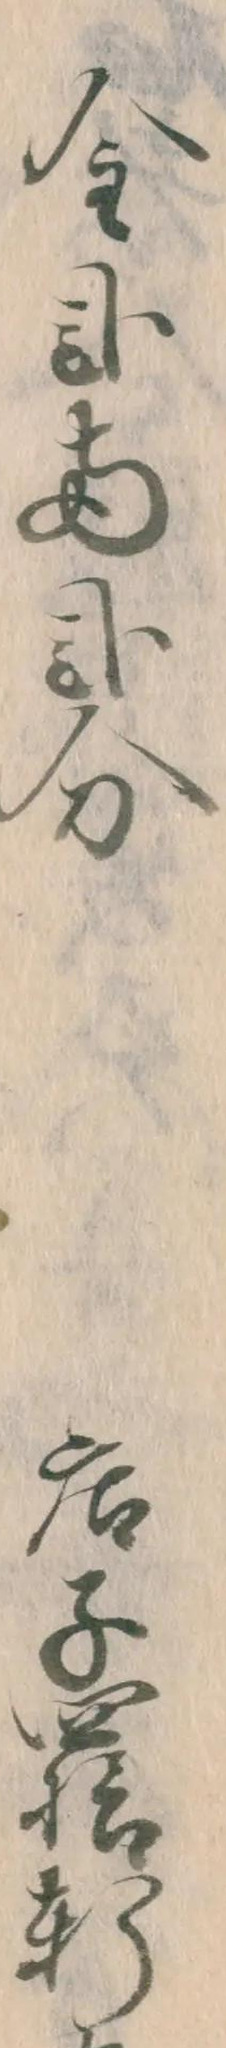金弐両弐分店子四拾軒え
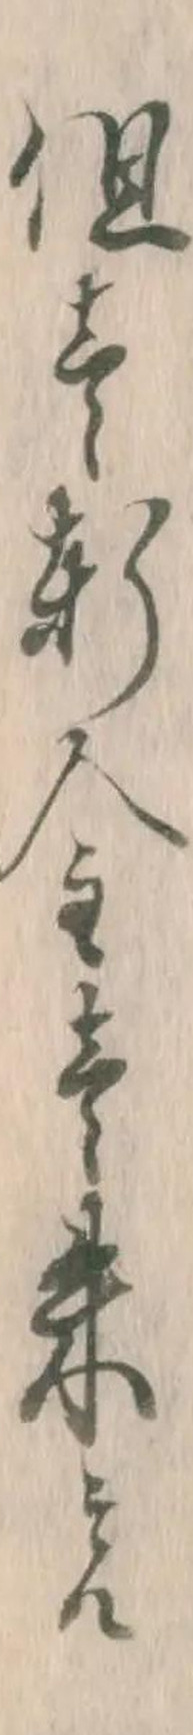但壱軒金壱朱宛
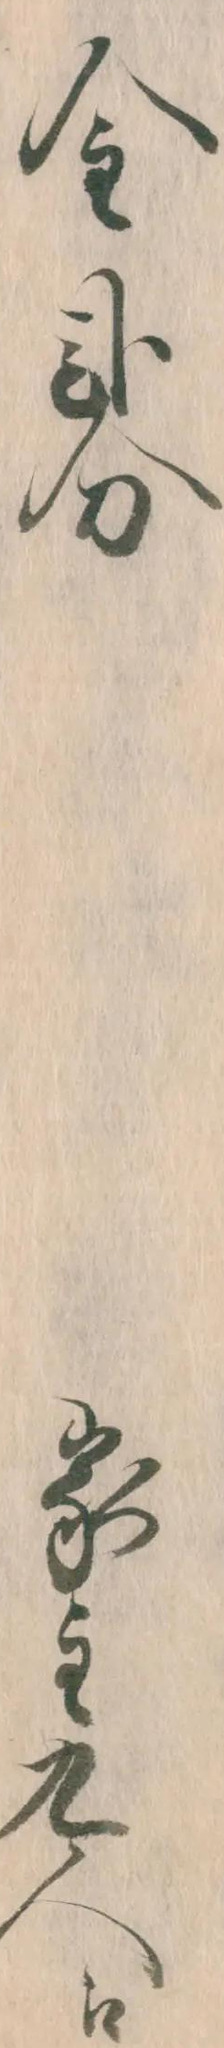金弐分家主九人え
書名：武家方并寺院等ニテ施差出候一件
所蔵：国立国会図書館 National Diet Library, JAPAN
